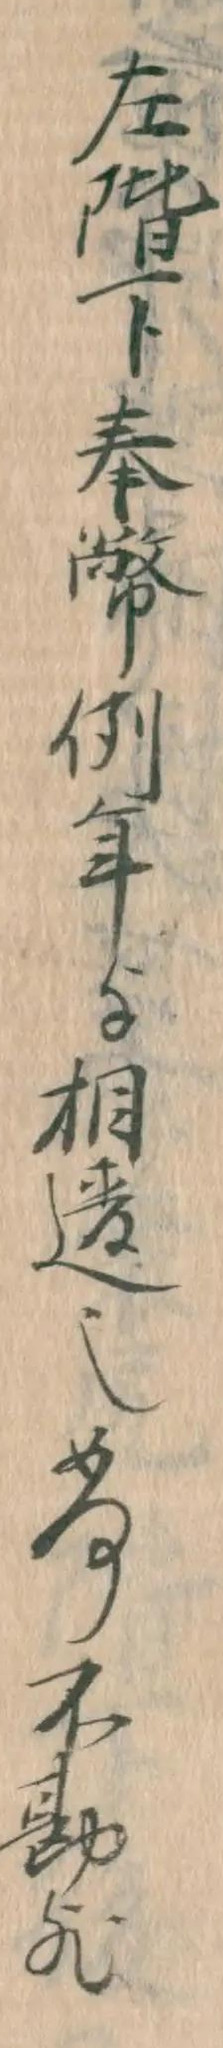左階下奉幣例年与相違也如何不勘歟
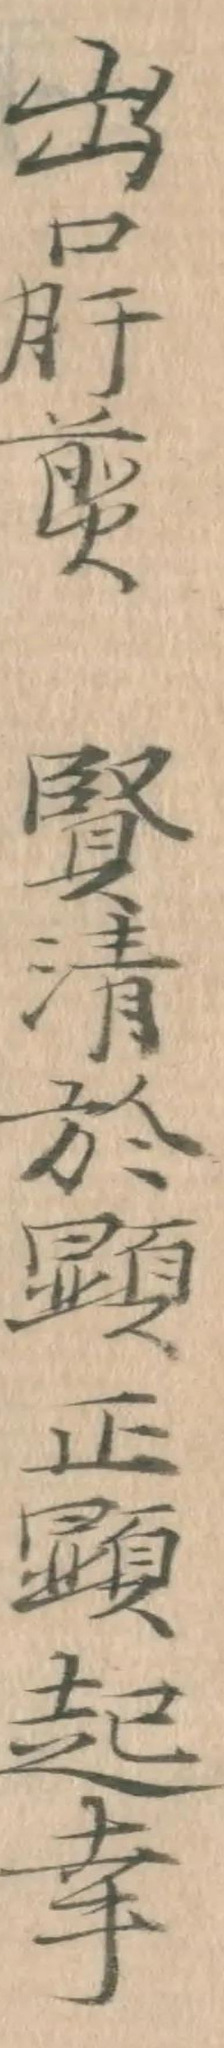出口肝煎賢清於顕正顕起幸
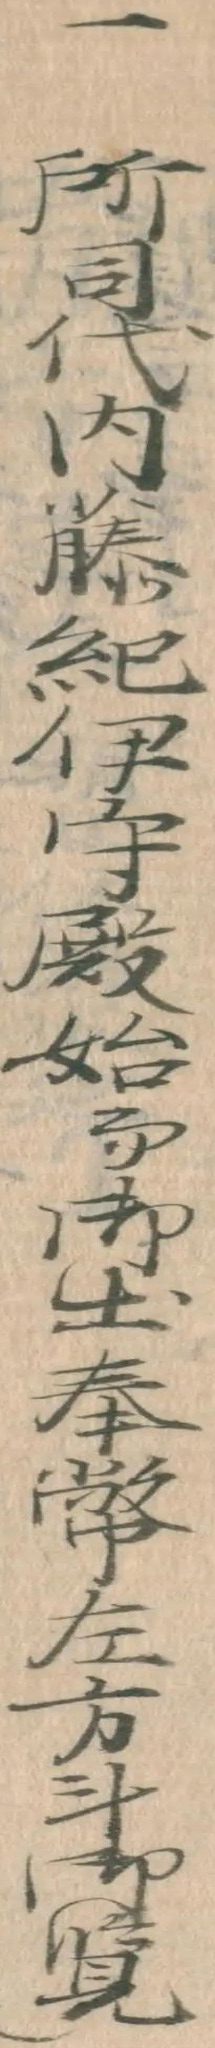一所司代内藤紀伊守殿始而御出奉幣左方計御覧也
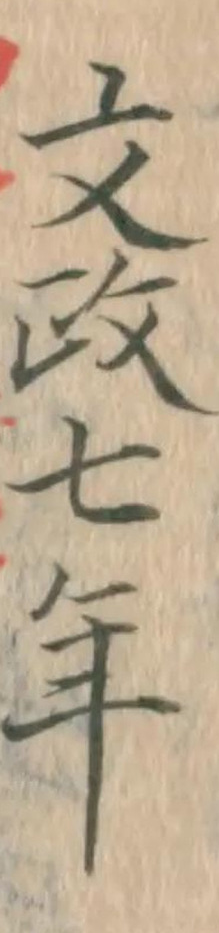文政七年
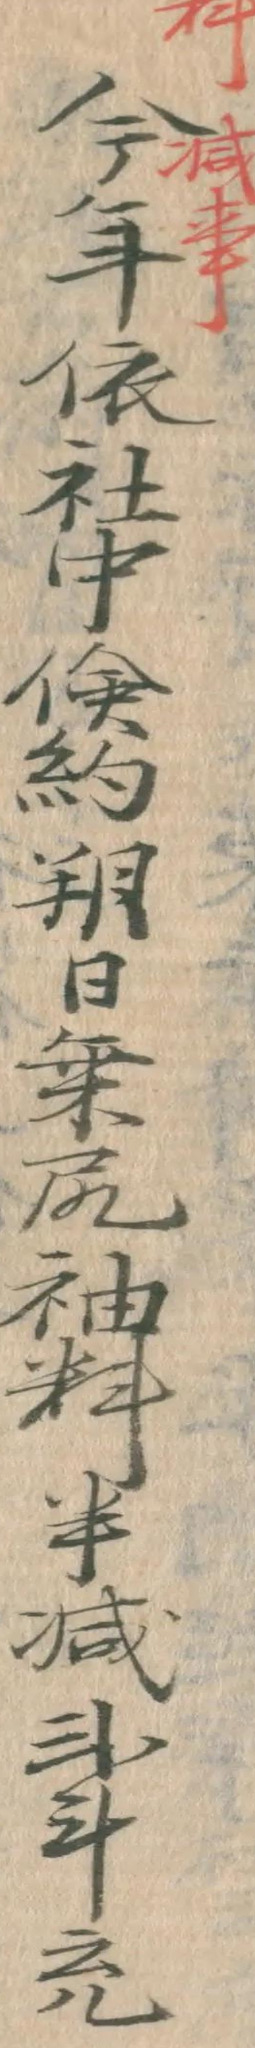一今年依社中倹約朔日乗尻袖料半減弐斗充
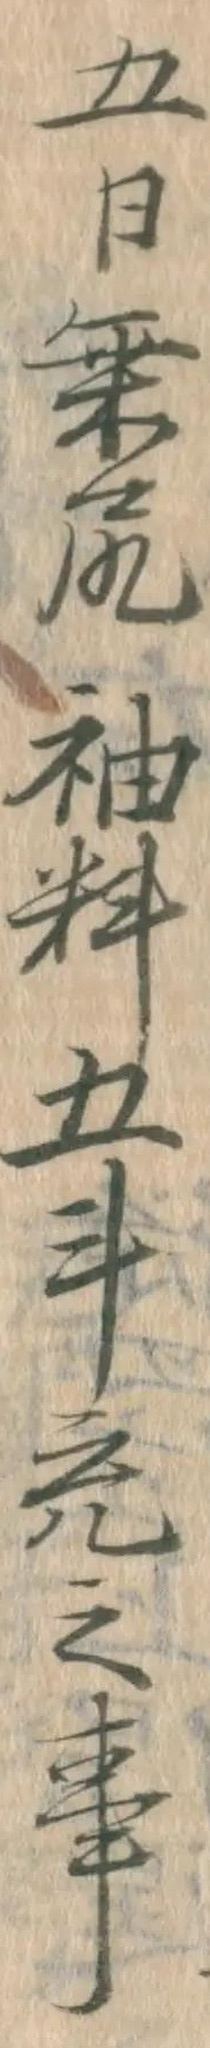五日乗尻袖料五斗充之事
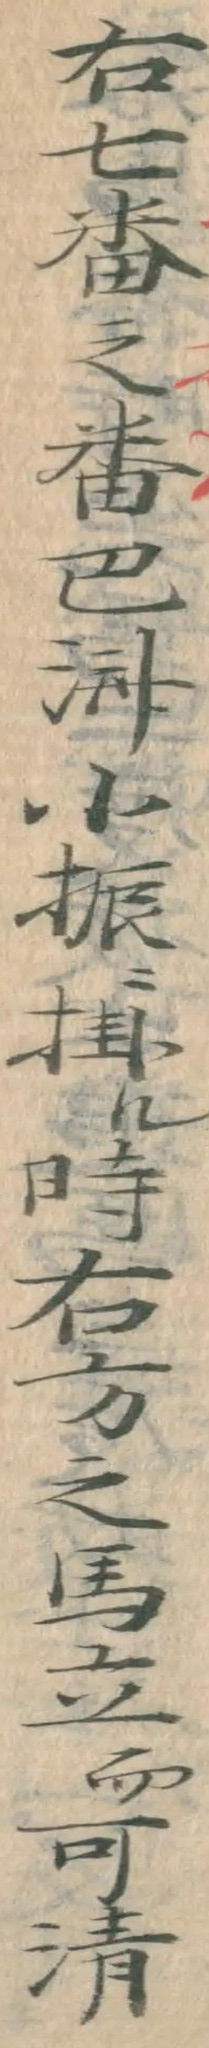右七番之番巴済小振ニ掛ル時右方之馬立而可清

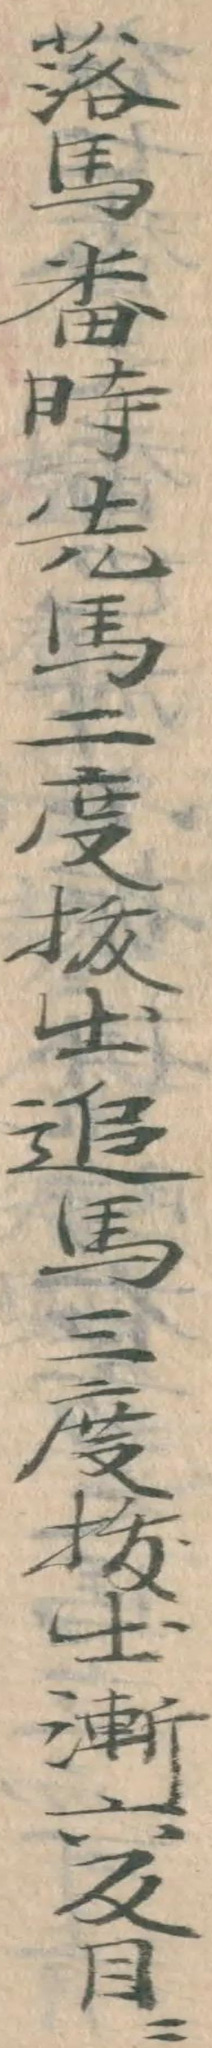落馬番時先馬二度拔出追馬三度抜出漸六反目ニ
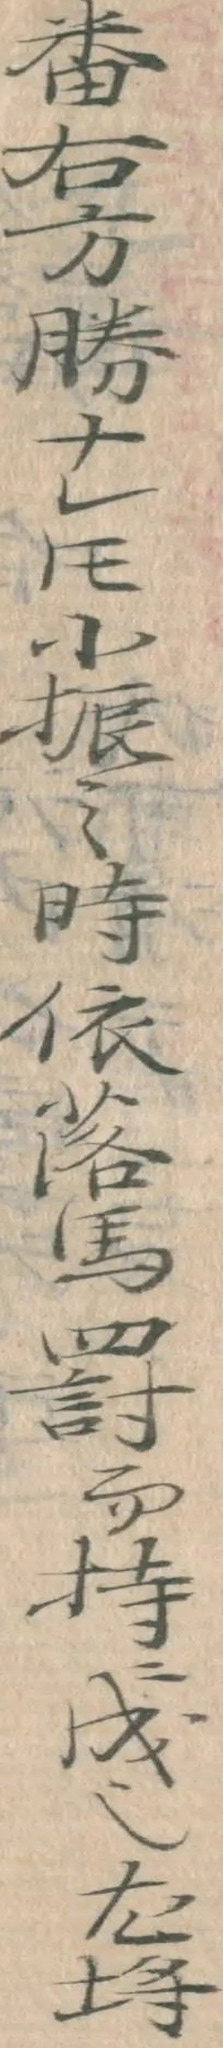番右方勝ナレトモ小振之時依落馬罰而持ニ成也尤埒
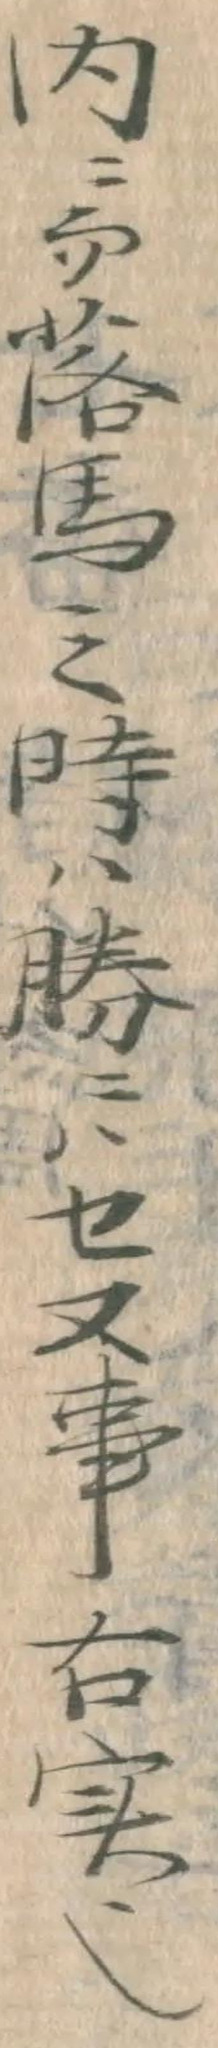内ニ而落馬之時ハ勝ニハセヌ事古実也
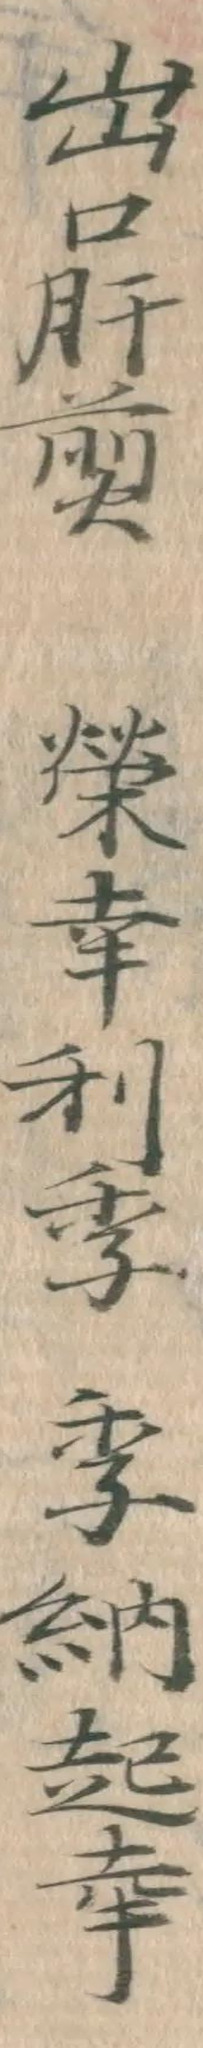出口肝煎榮幸利季季納起幸
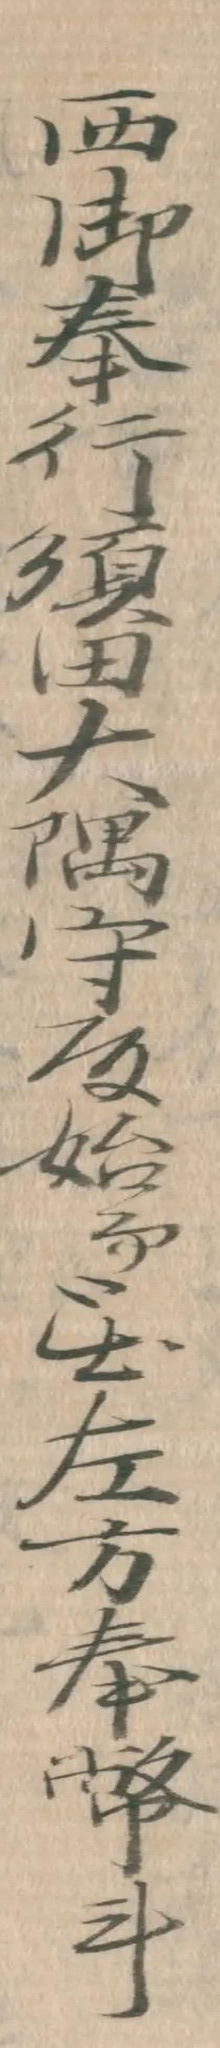一西御奉行須田大隅守殿始而御出左方奉幣計
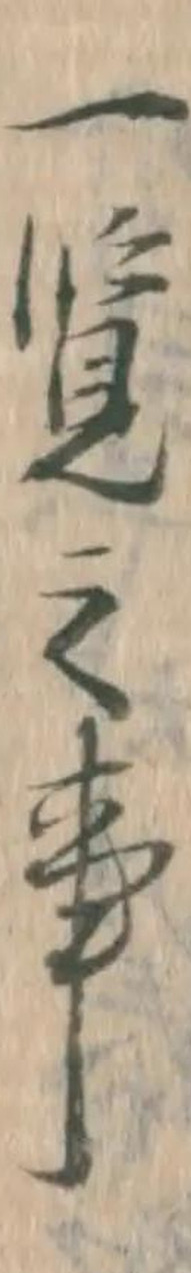一覧之事
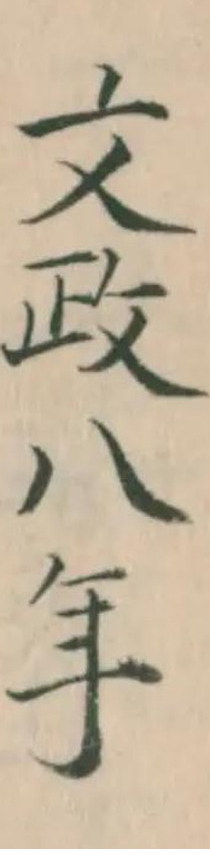文政八年
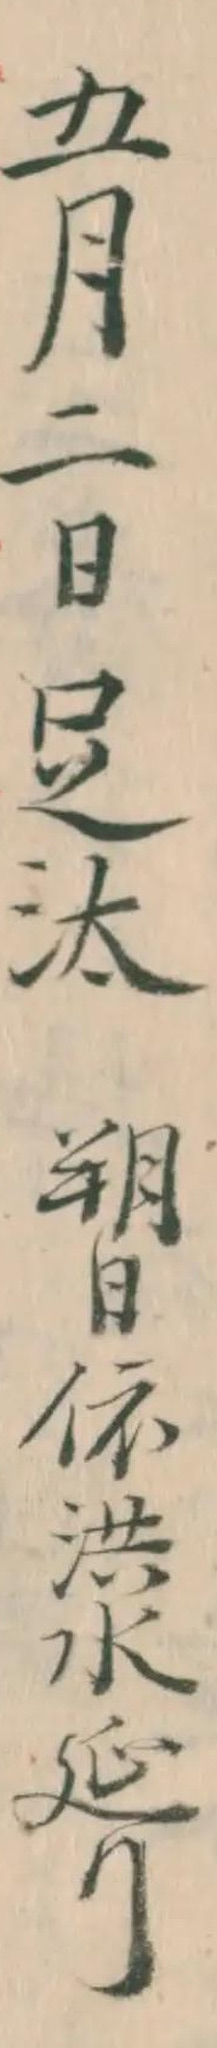五月二日足汰朔日依洪水延行
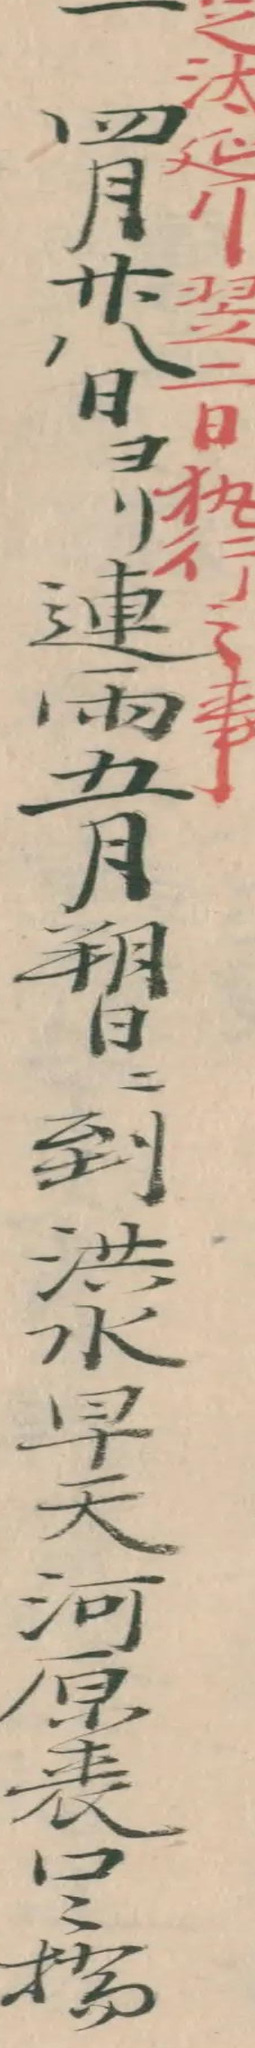一四月廿八日ヨリ連雨五月朔日ニ到洪水早天河原表口々橋
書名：賀茂社記録. 第10冊
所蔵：国立国会図書館 National Diet Library, JAPAN
